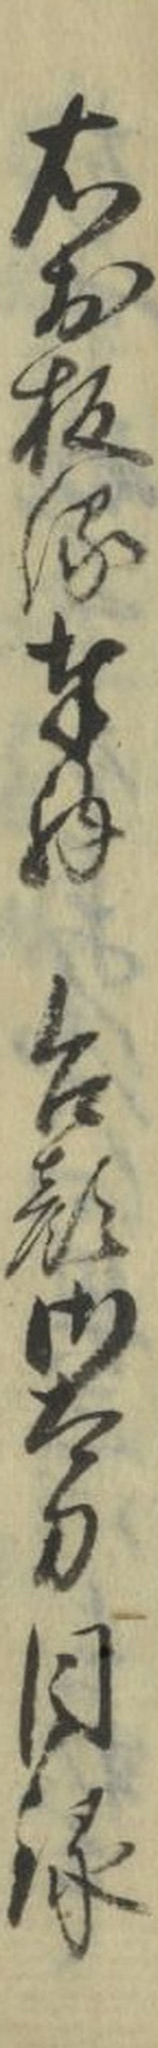右於板縁奉拝台顔御太刀目録
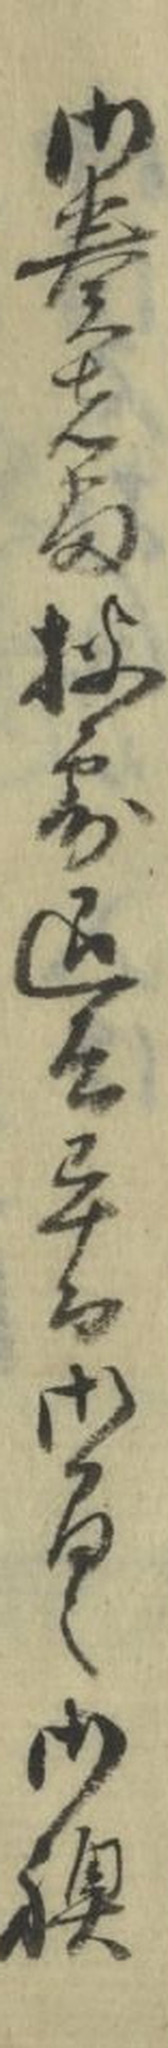御奏者番披露退去畢て御間之御襖
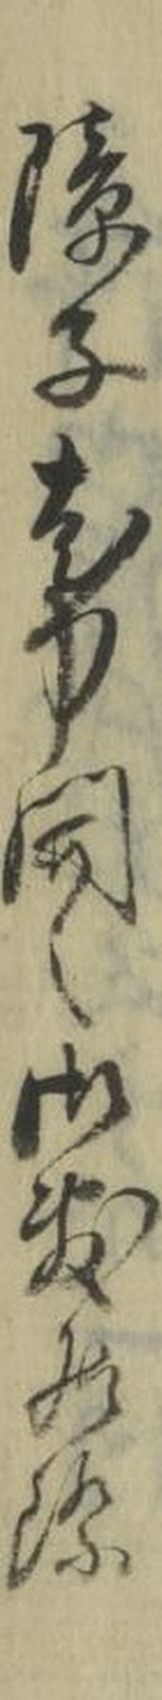障子老中開之御敷居際

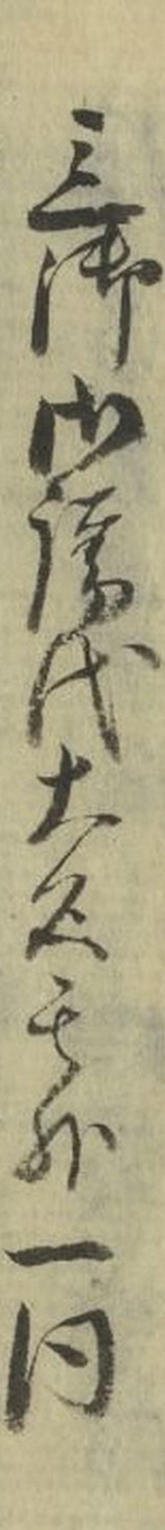迄御御譜代大名其外一同
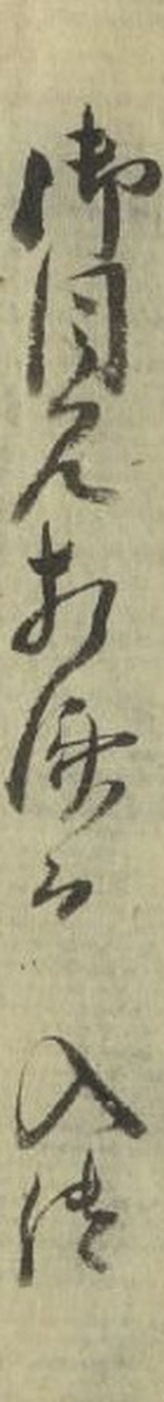御目見相済て入御
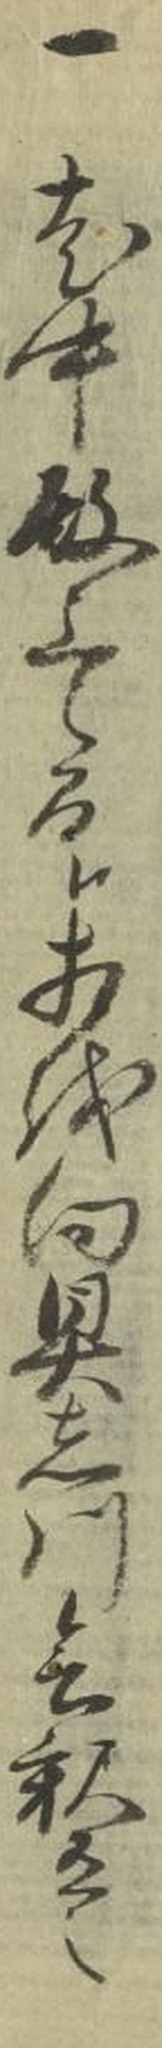一老中殿上之間え相越向具志川会釈有之
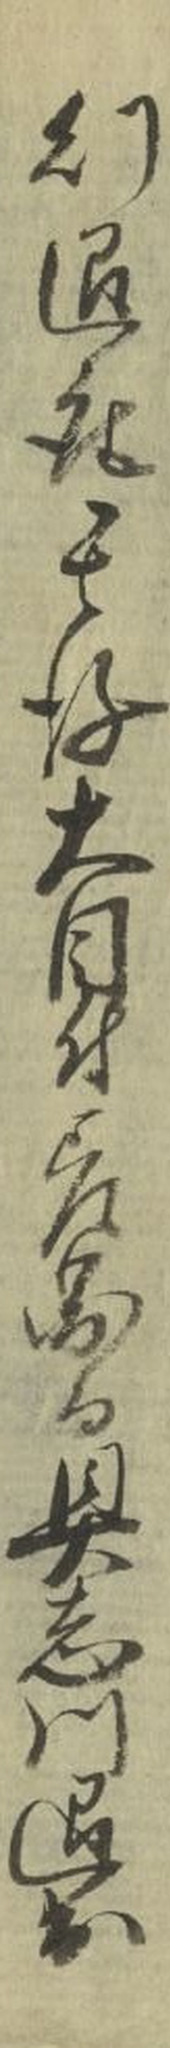則退座其後大目付差図而具志川退出
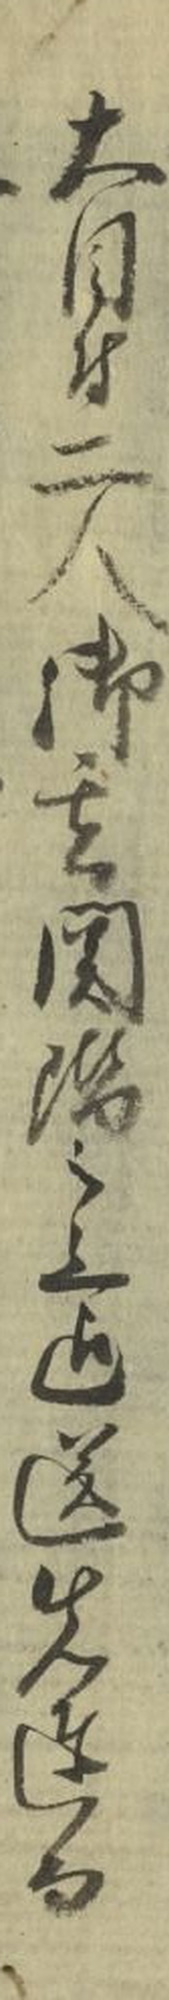大目付二人御玄関階之上迄送先達て
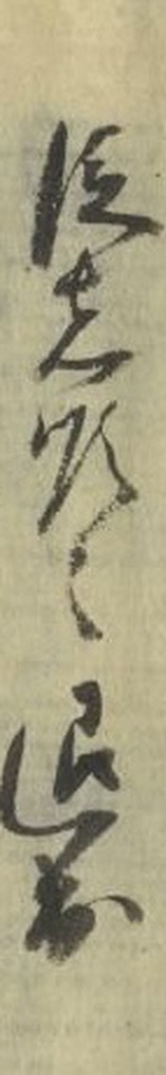従者順々退出
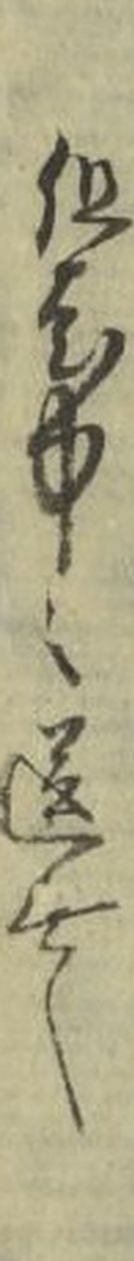但老中之送無之
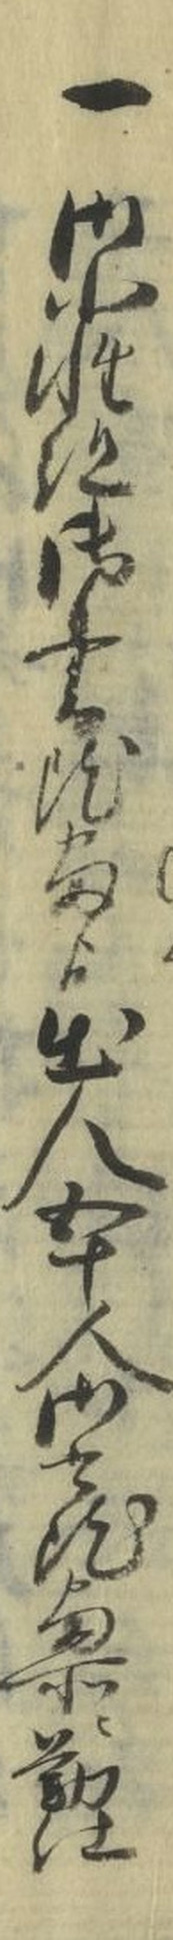一御小性組御書院番ゟ出人五十人御書院番所に勤仕
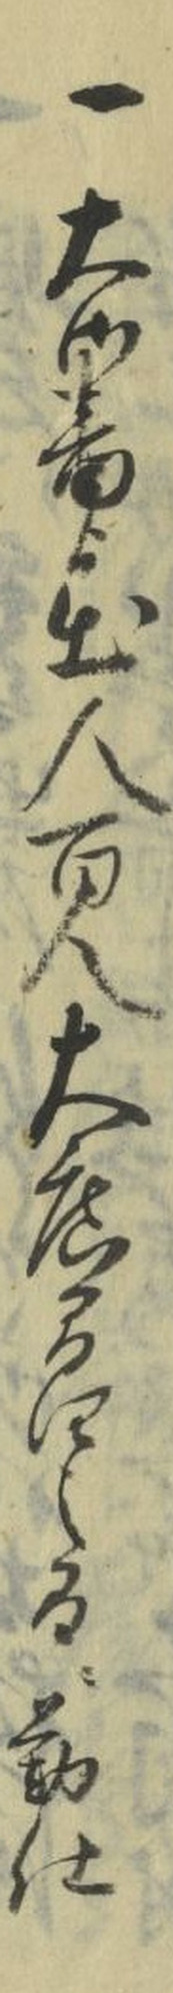一大御番ゟ出人百人大広間四之間に勤仕
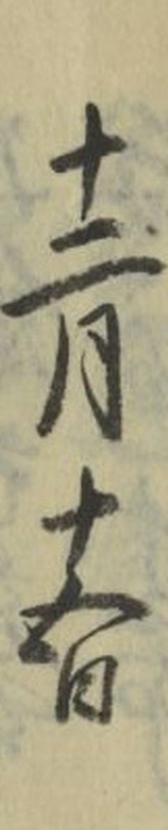十二月十五日
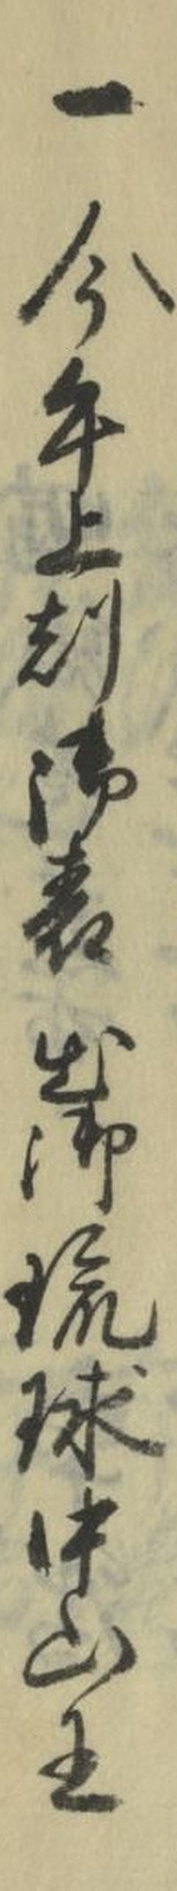一今午上刻御表出御琉球中山王
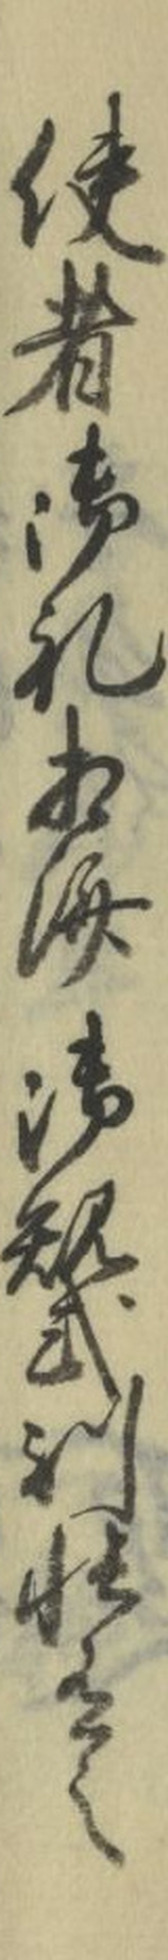使者御礼相済御規式別帳有之
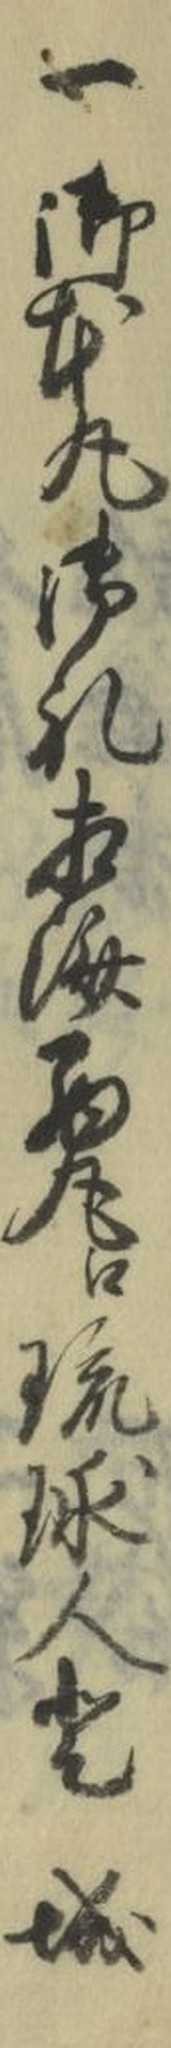一御本丸御礼相済西丸え琉球人登城
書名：戊辰琉球人来朝之式 全
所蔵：University of the Ryukyus Library
